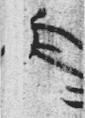內內
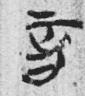言
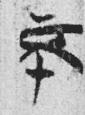不
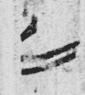㠯（以）
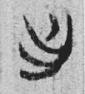出
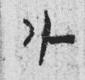外
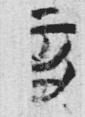言
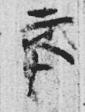不
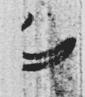㠯（以）
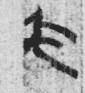內（入）
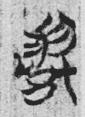興
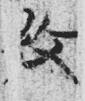{𡵂攴}（美）
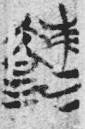灋（廢）
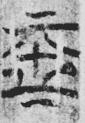亞（惡）
